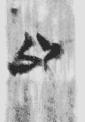父
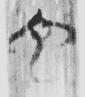它
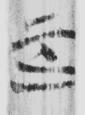正
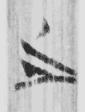之
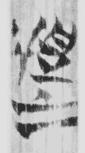道
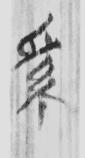奚
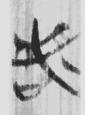若
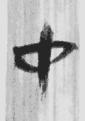中
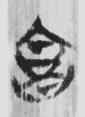合
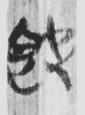既
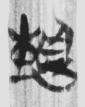埶
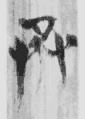承
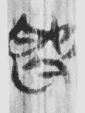既
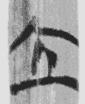立
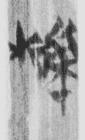{木甫}
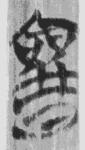噞
